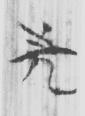先
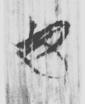母
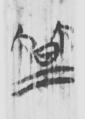替
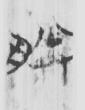朕
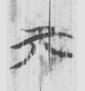亓
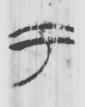于
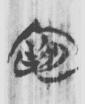龜
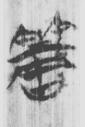{丨卩}
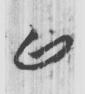㠯（以）
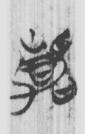{靜口}
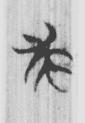求
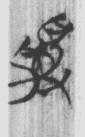嘉
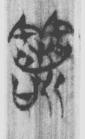{竹若}
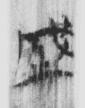城
